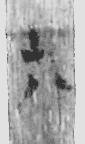{十八}
